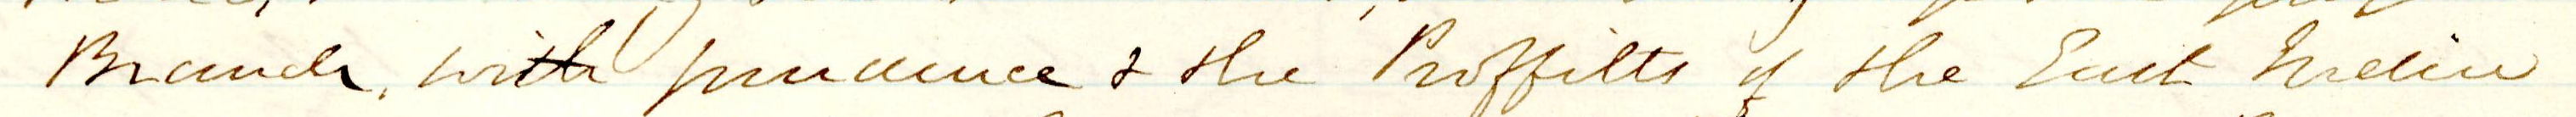Branch with prudence & the proffitts of the East India
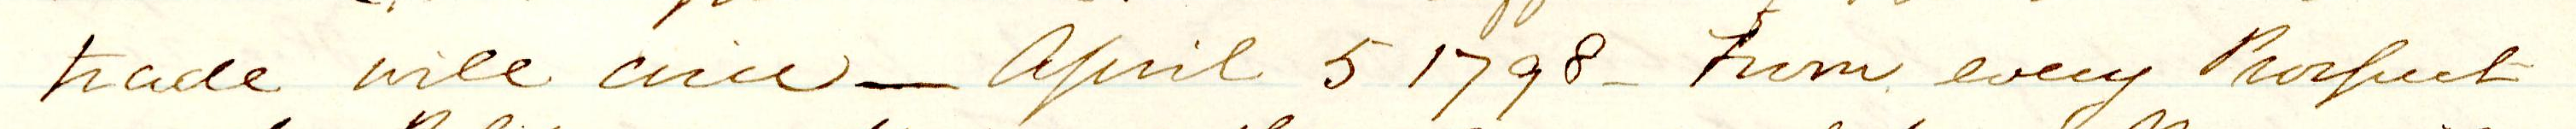trade will aid- April 5 1798- from every Prospect
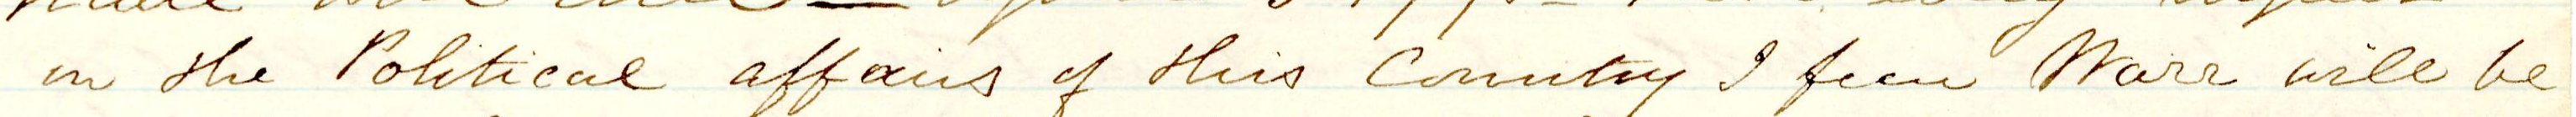in the Political affairs of this country I fear Warr will be
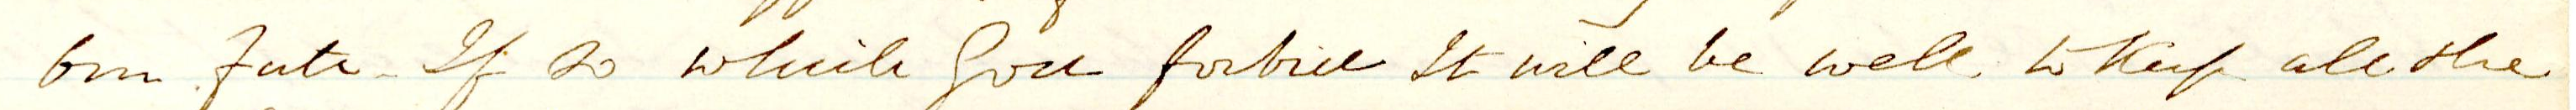but fate- If so which God forbid it will be well to keep all the
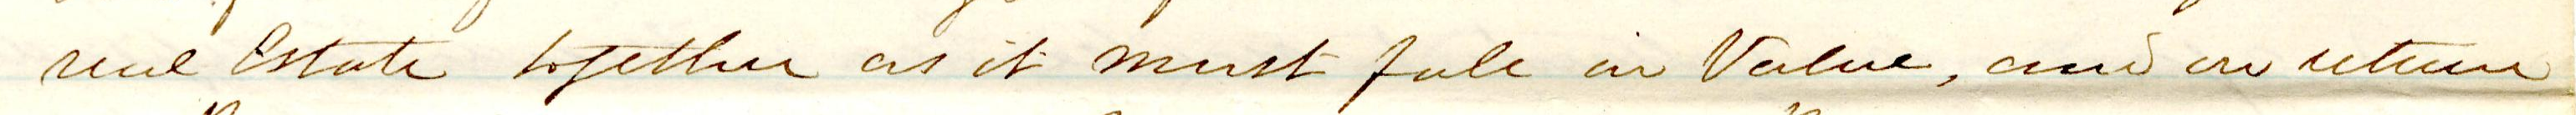Real Estate together as it must fall in Value, and in return
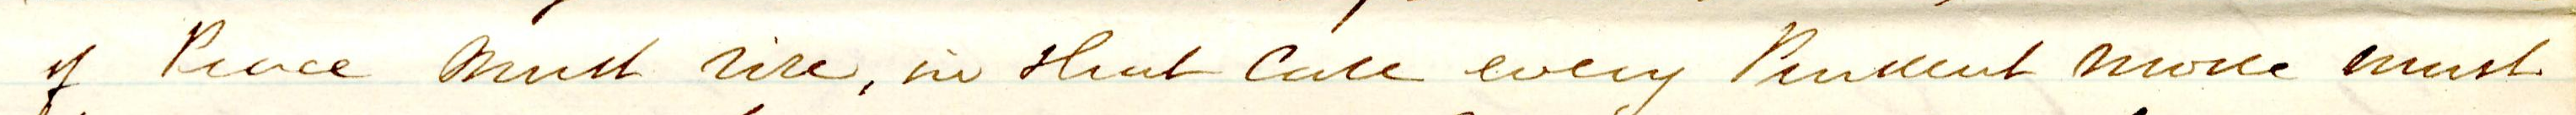of Peace must rise, in that case every Prudent mode must
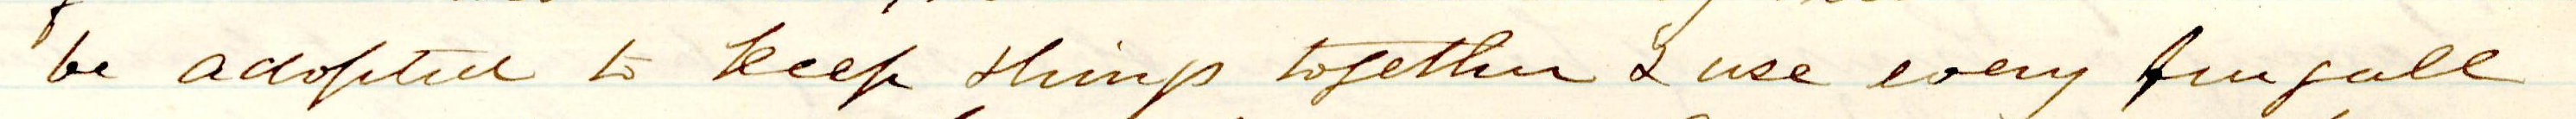be adopted to keep things together & use every frugall
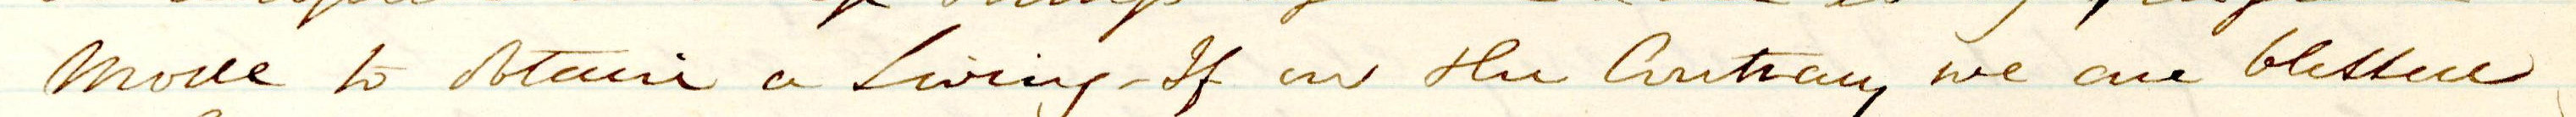Move to obtain a Laving- If in the country we are blessed
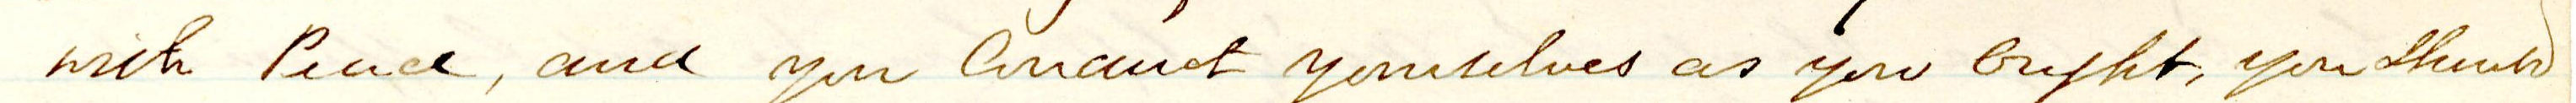with Peace, and you account yourselves as you ought, you should
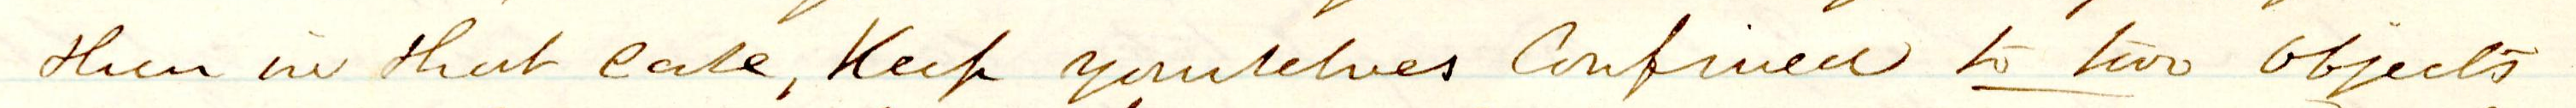then in that case Keep yourselves confined to two objects
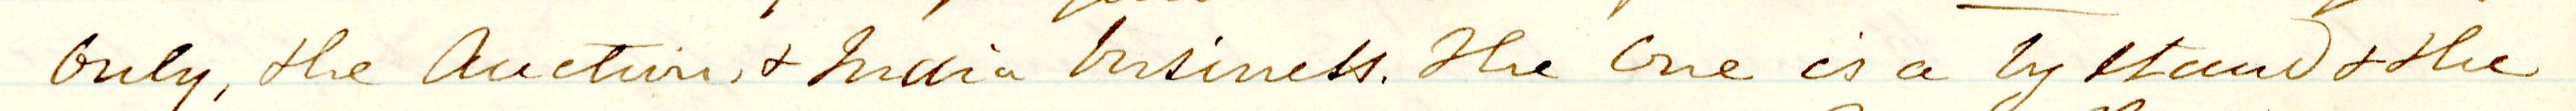only, the auctions & India business. the one is a by stand & the
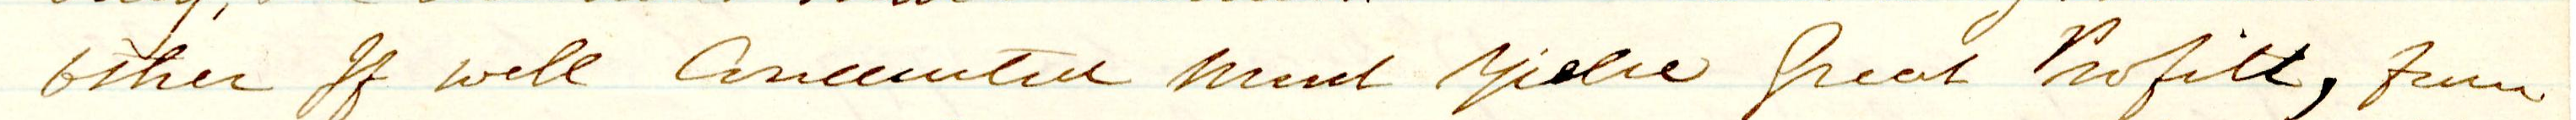other If well conducted must yield Great Profitt, from
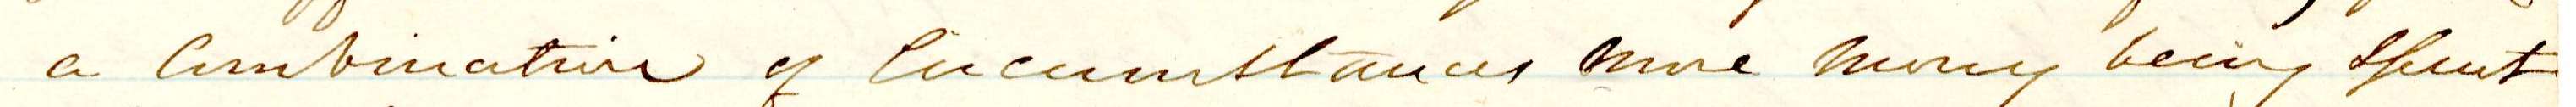a combination of circumstances were since money being difecult
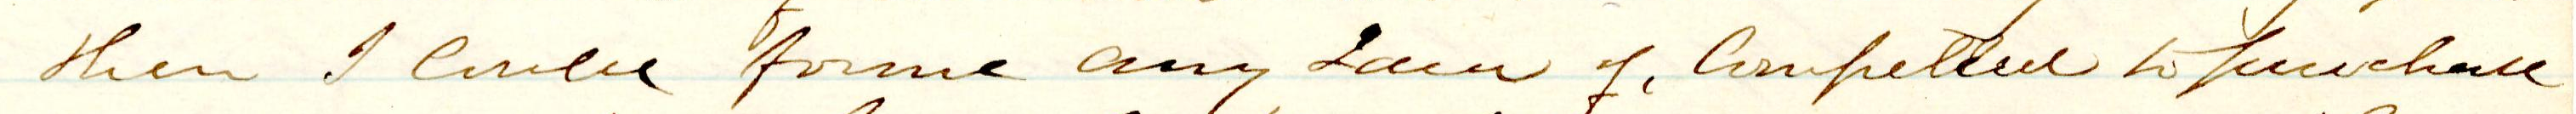then I could forme Idea of, compelled to purchase
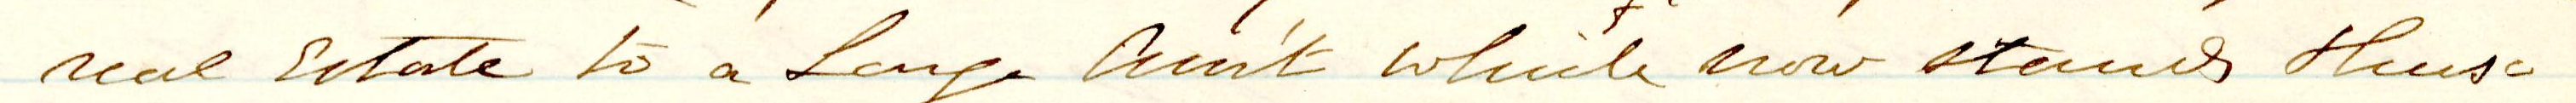real Estate to a large Acct while now stands thus
